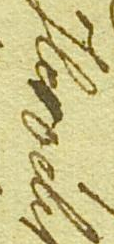Herocles.
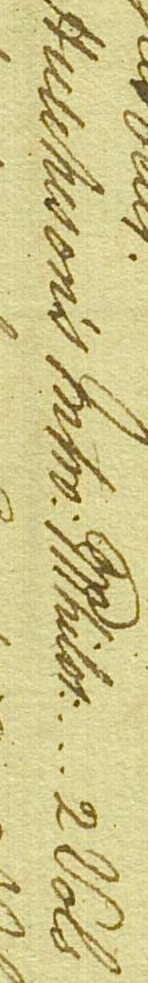Hutcheson's Intro. Philos... 2 Vols
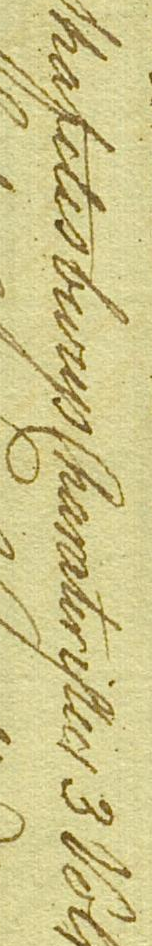Shaftesburys Charateristics 3 Vols
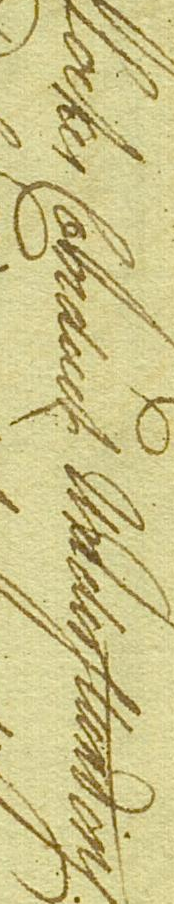Lockes Conduct Understanding.
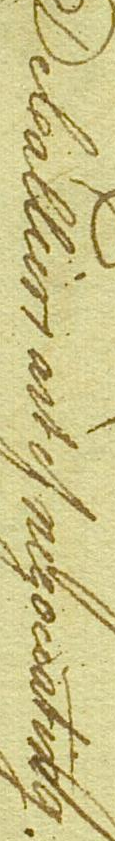Deballiors art of negociating.
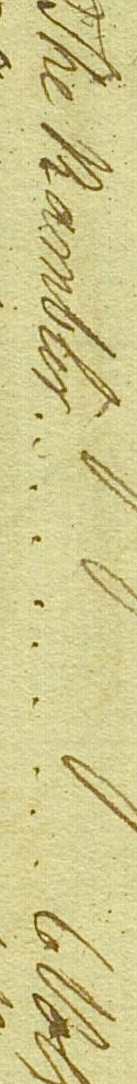The Rambler ........... 6 Vols
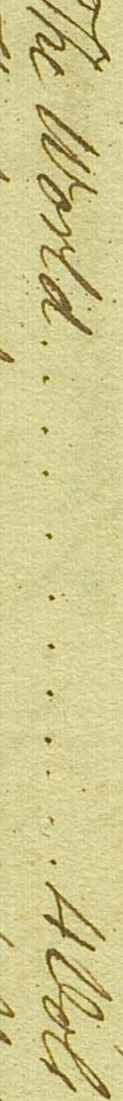The World . . . . . . . . . . . . 4 Vols
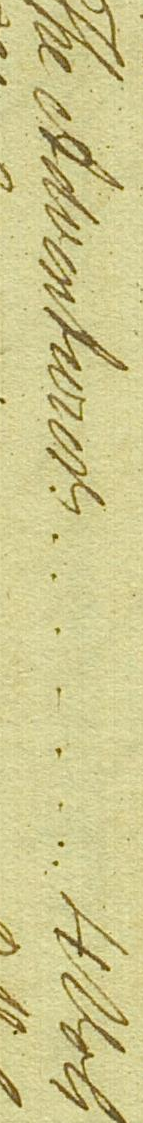The Adventurer . . . . . . . . . . . . 4 Vols
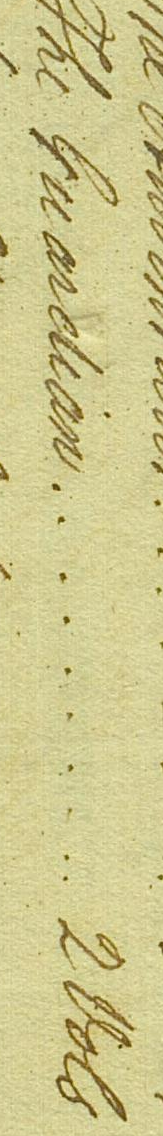The Guardian . . . . . . . . . . . . 2 Vols
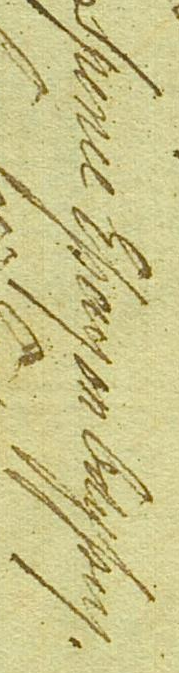Spence Essay on Odyssey.
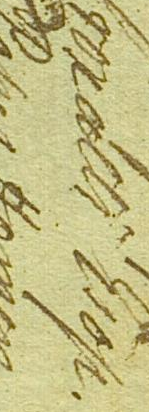Croxall's Esop.
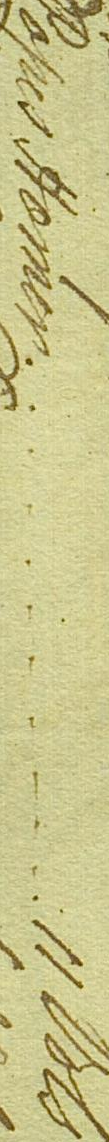Popes Homer . . . . . . . . . . . . 11 Vols
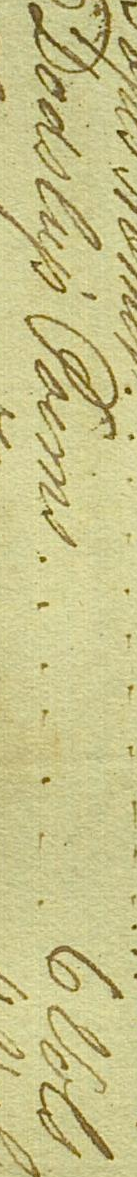Dodsley's Poems . . . . . . 6 Vols
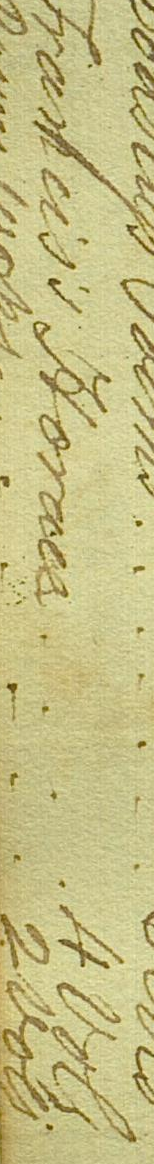Francis's Horace . . . . 4 Vols.
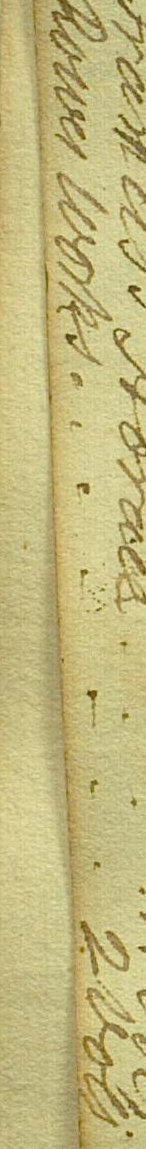Rowes Works . . . . . . . 2 Vols
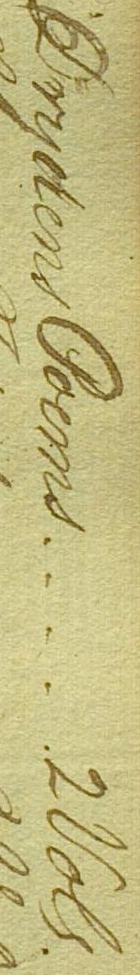Drydens Poems . . . . . 2 Vols.
